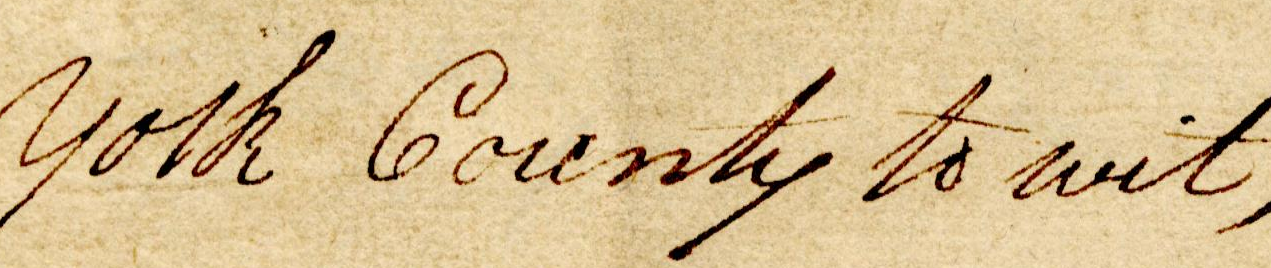Yolk County to wit,
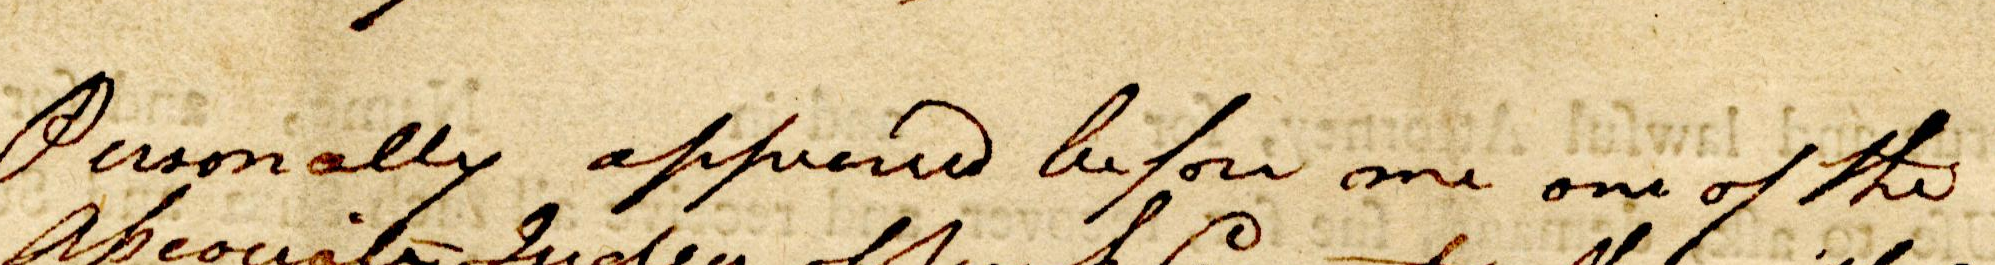Personally appeared before me one of the
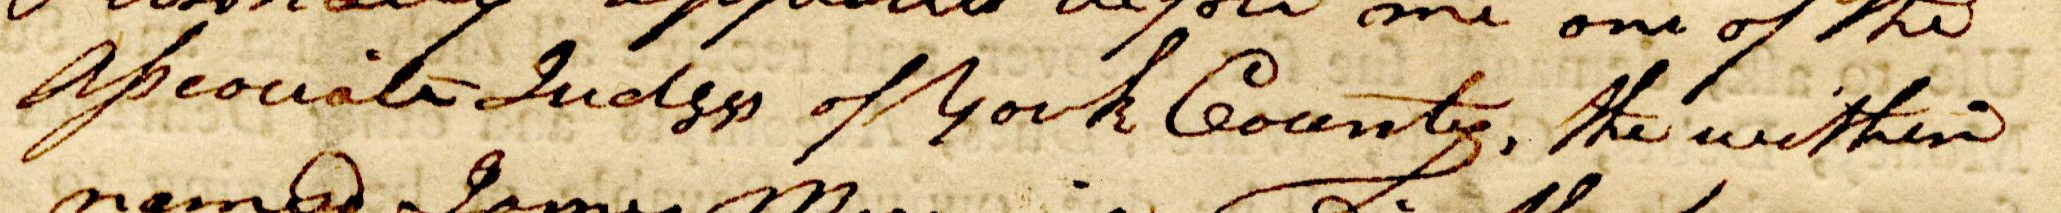asseociate Judges of York County, the within
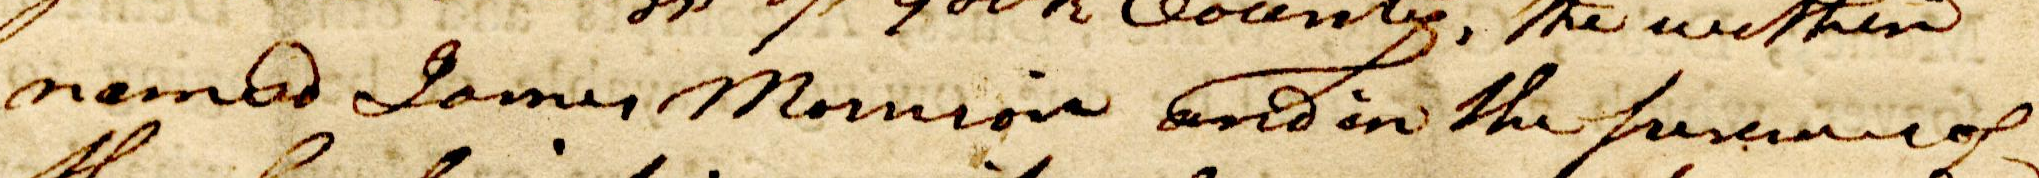named James Morrison and in the presence of
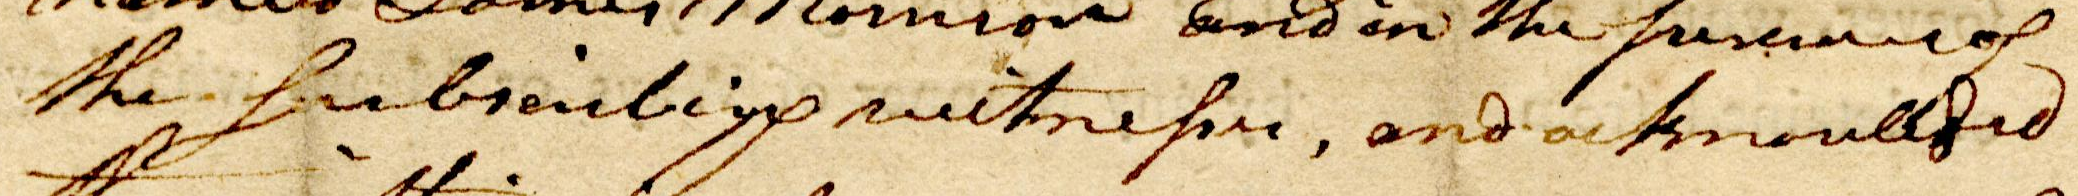the subscribing witnesses, and acknowledged
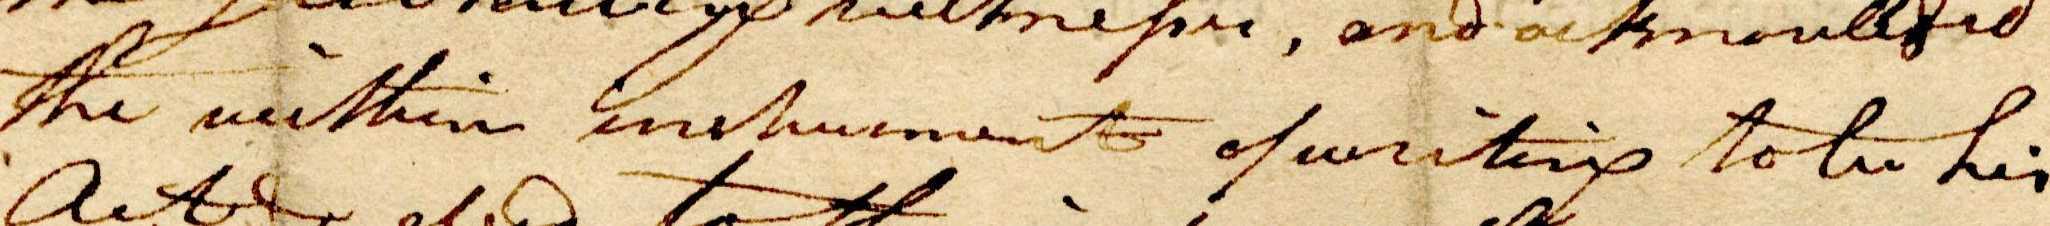the within instruments of writing to be his
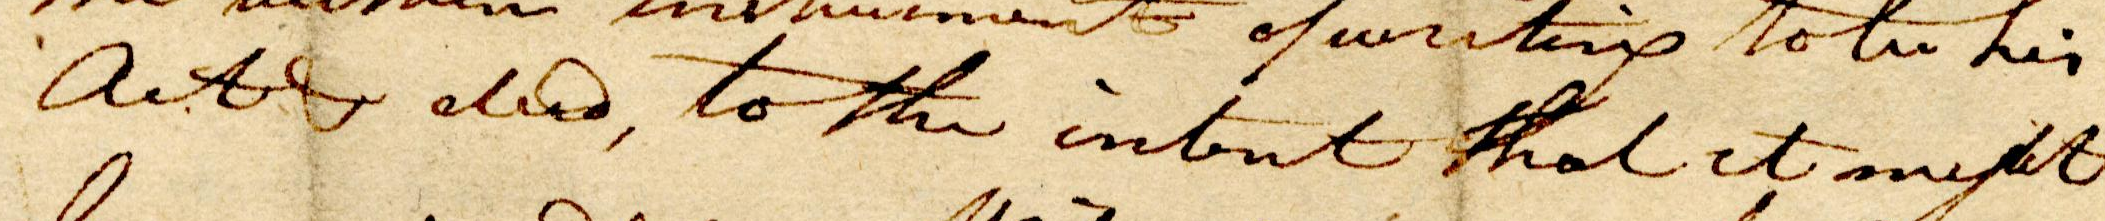Act & deed, to the intent that it might
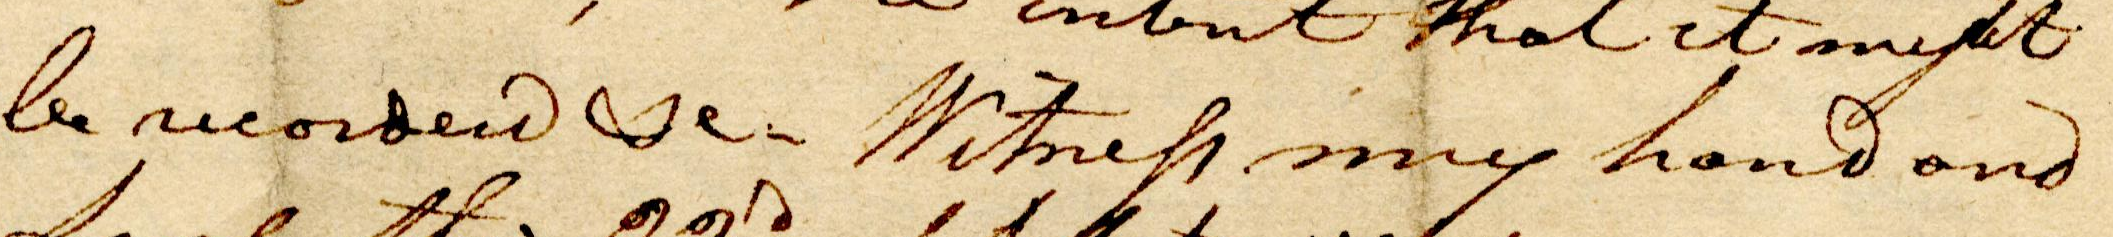be recorded &c. Witness my hand and
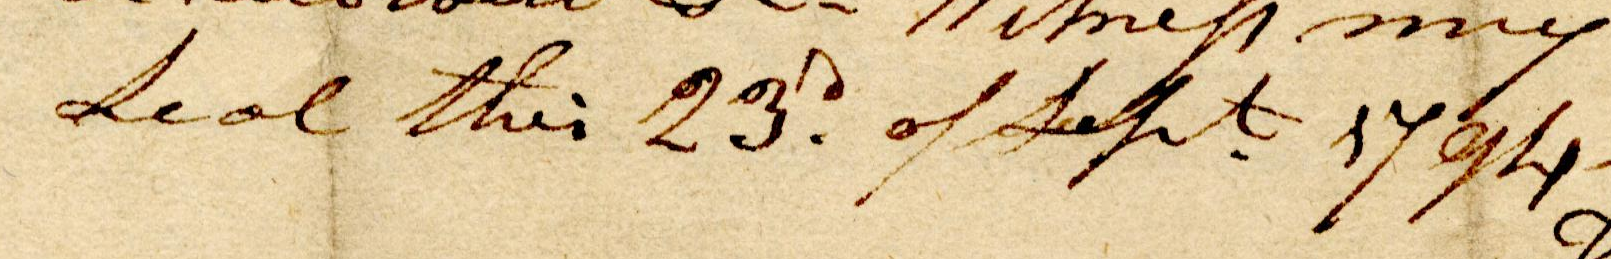Seal this 23^d. of Sept 1794
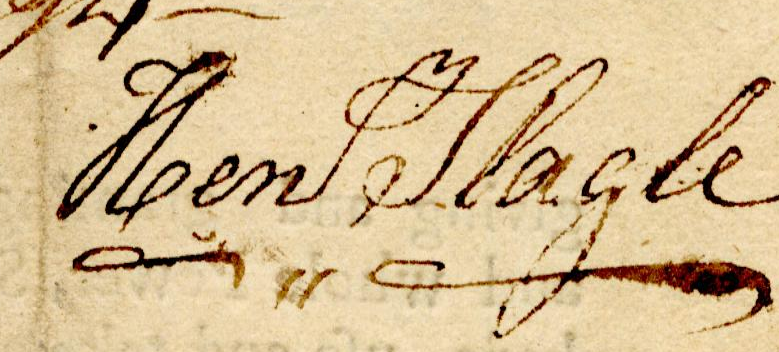Hen^y l Slagle
